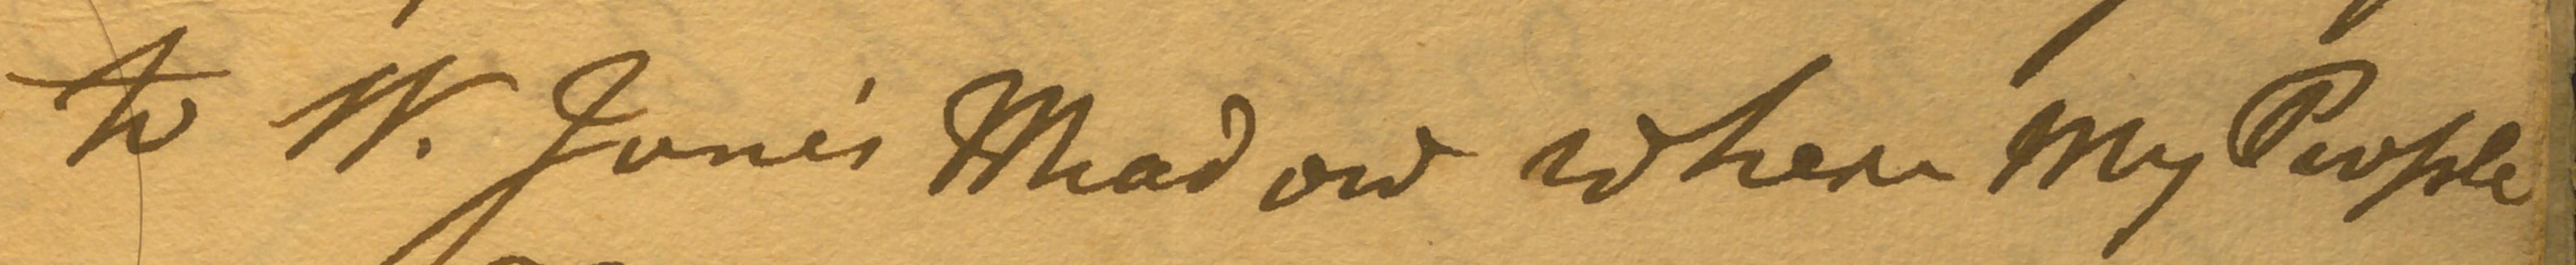to W. Jone's Meadow where My People
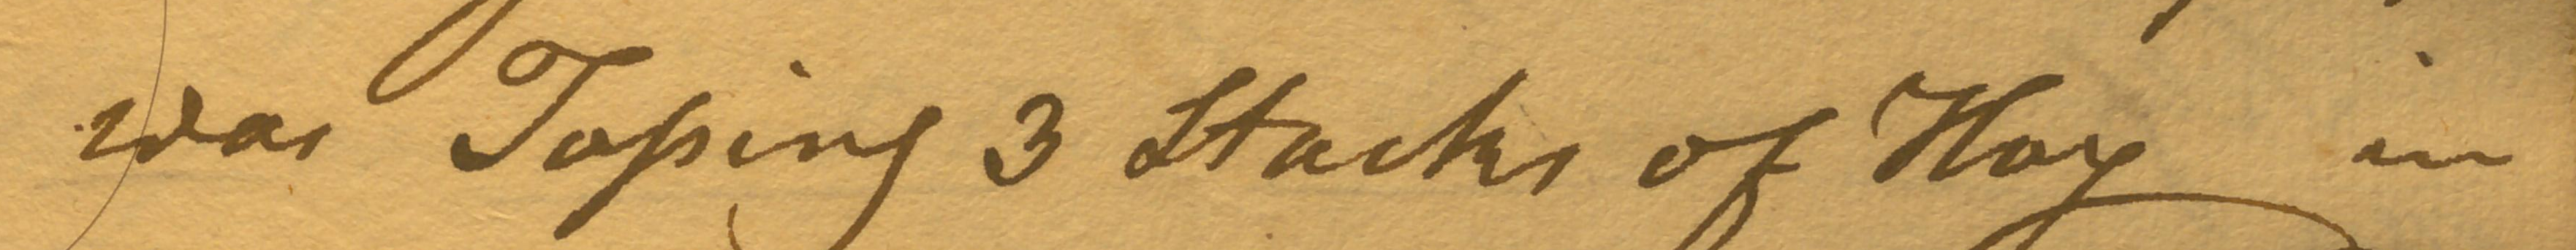was Toping 3 Stacks of Hay in
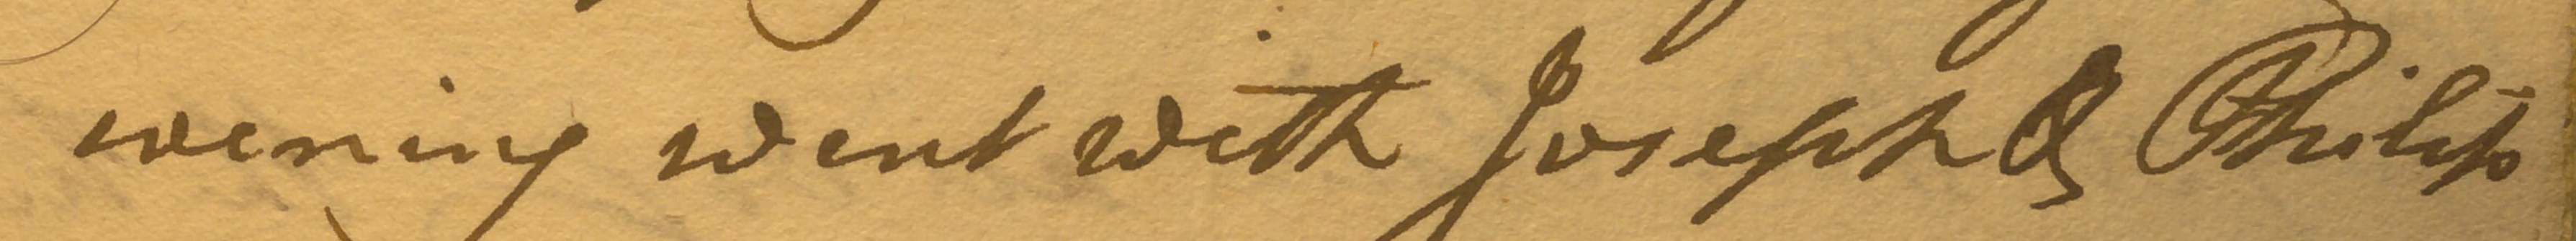evening went with Joseph & Philip
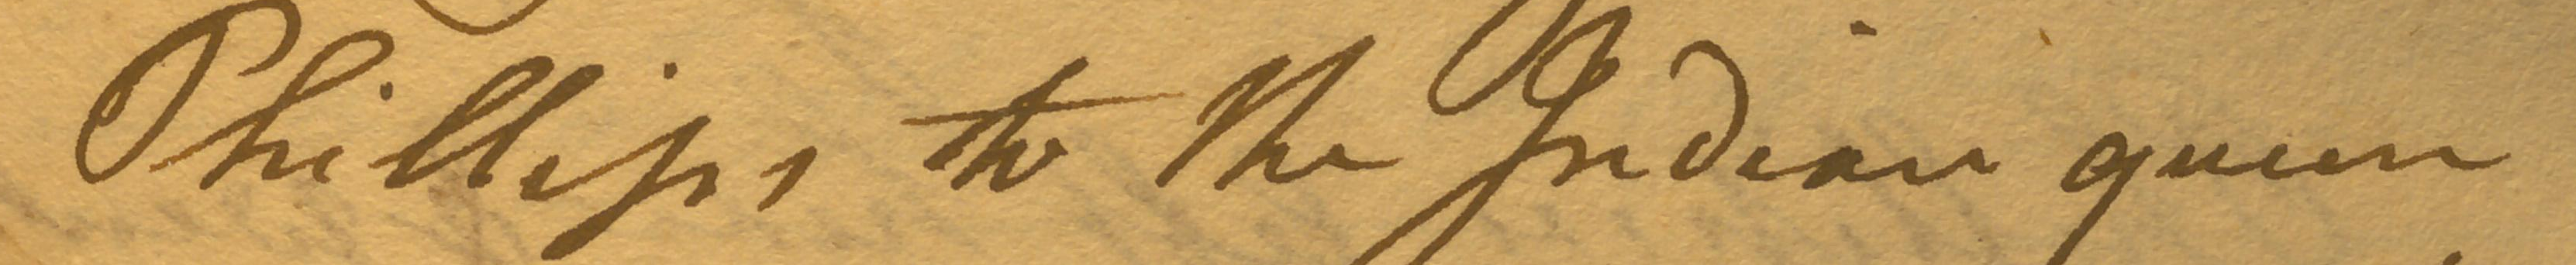Phillips to the Indian queen
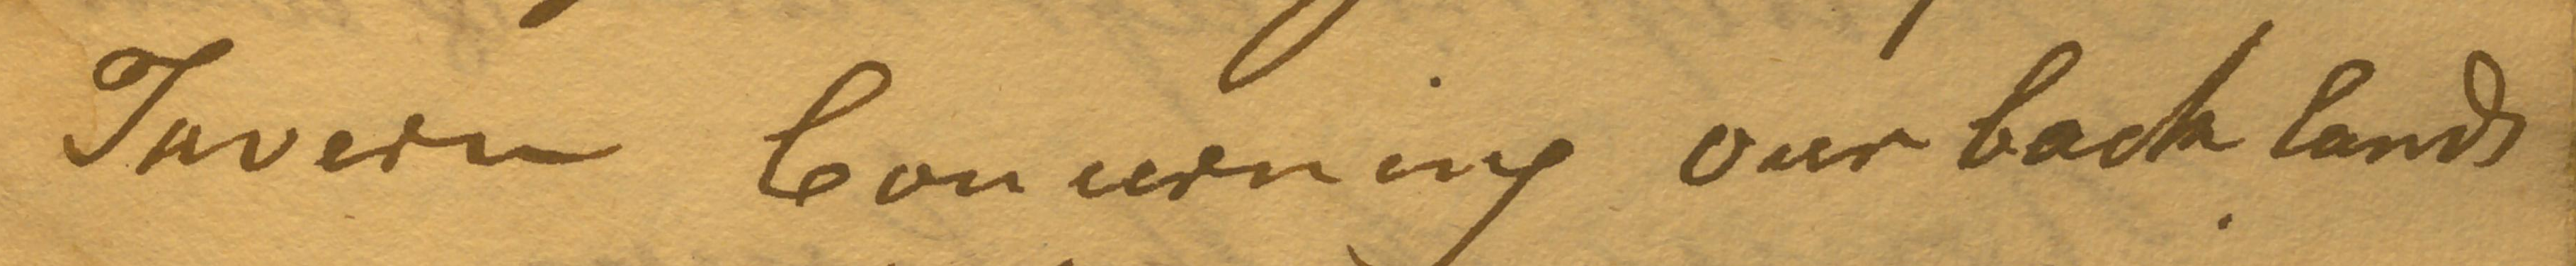Tavern Concerning our back lands
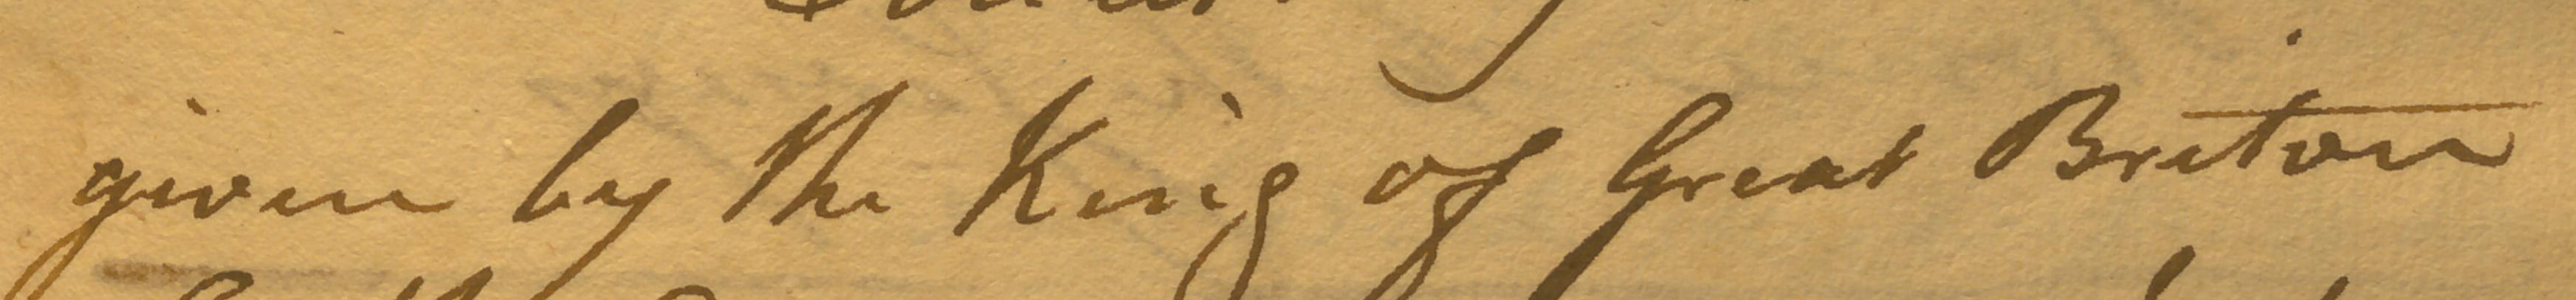given by the King of Great Briton
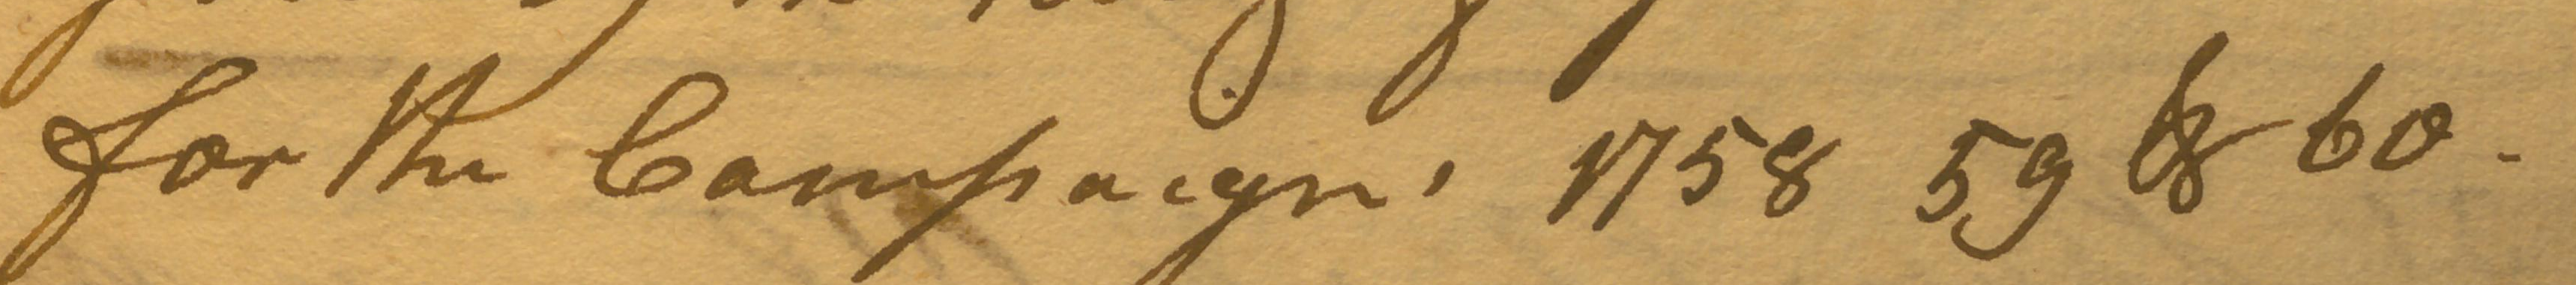for the Campaigns 1758 59 & 60-
